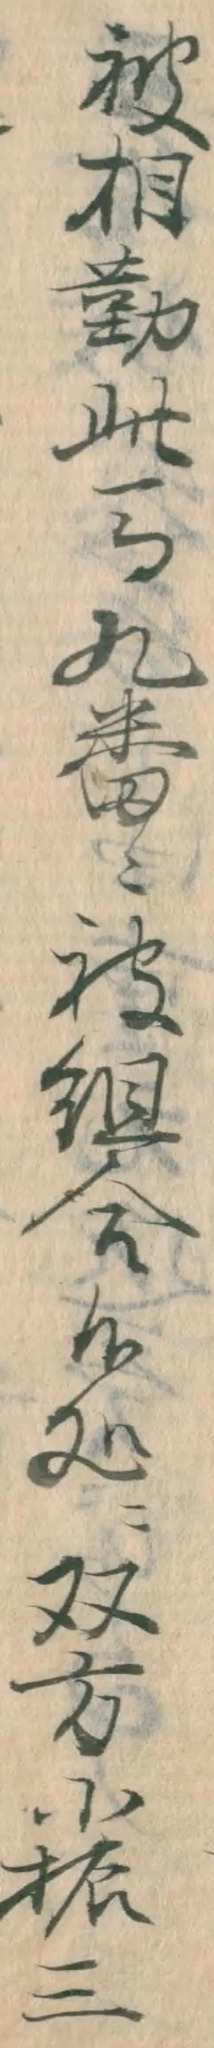被相勤此馬九番ニ被組合候処ニ双方小振三
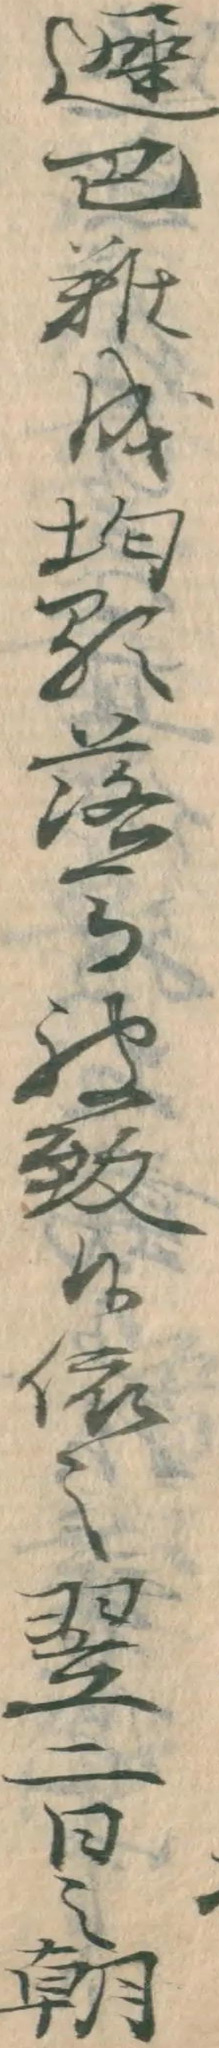遅巴難成均顕落馬被致候依之翌二日之朝
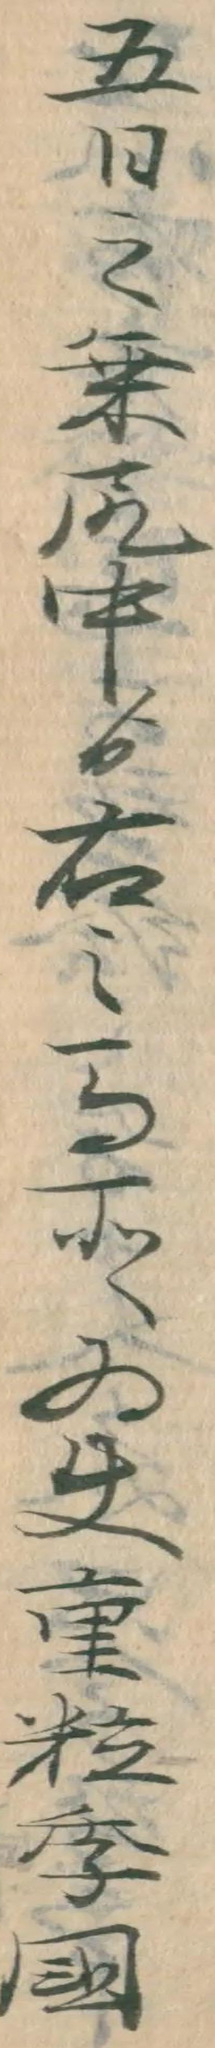五日之乗尻中ゟ右之馬所へ為使重粒季国

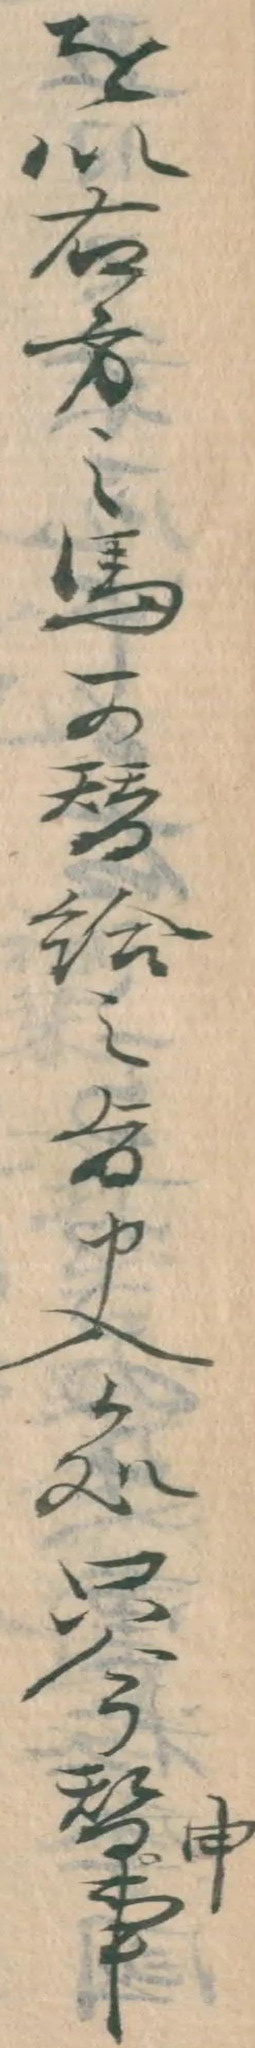を以右方之馬可替給之旨申入候処只今替事
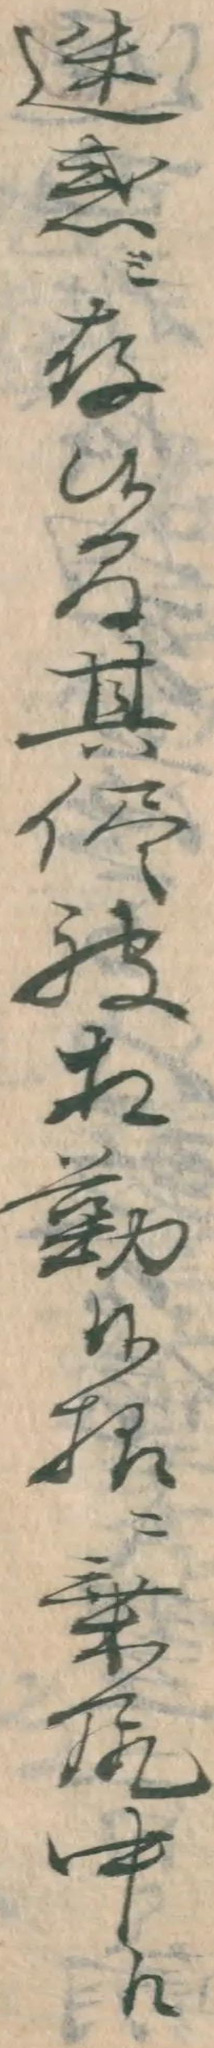迷惑ニ存候間其侭被相勤候様ニ乗尻中江
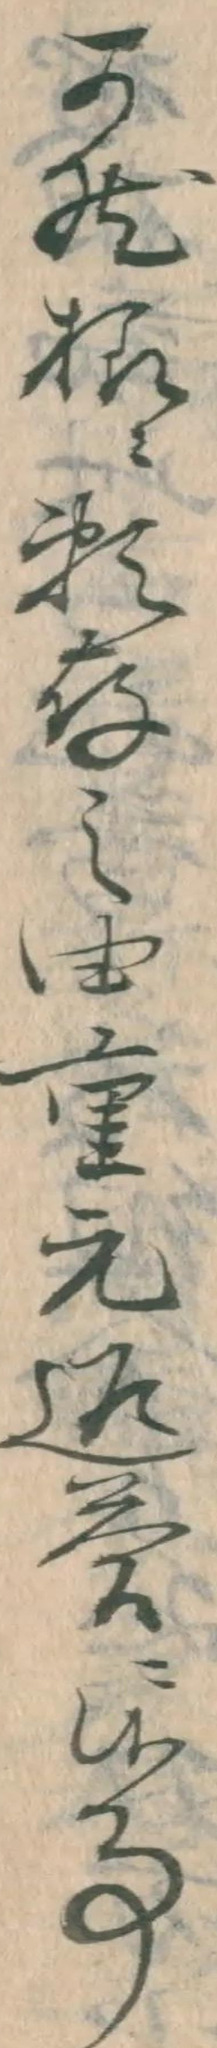可然様ニ頼存之由重元返答ニ候事
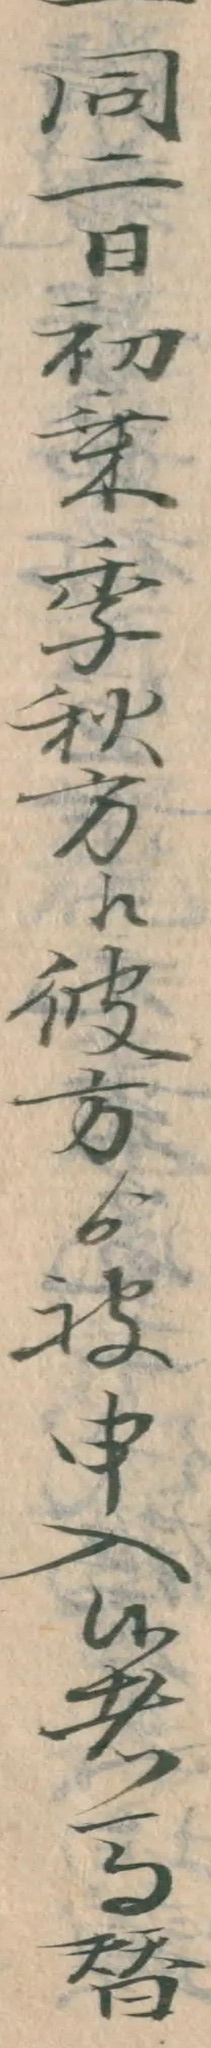一同二日初乗季秋方江彼方ゟ被申入候者馬替
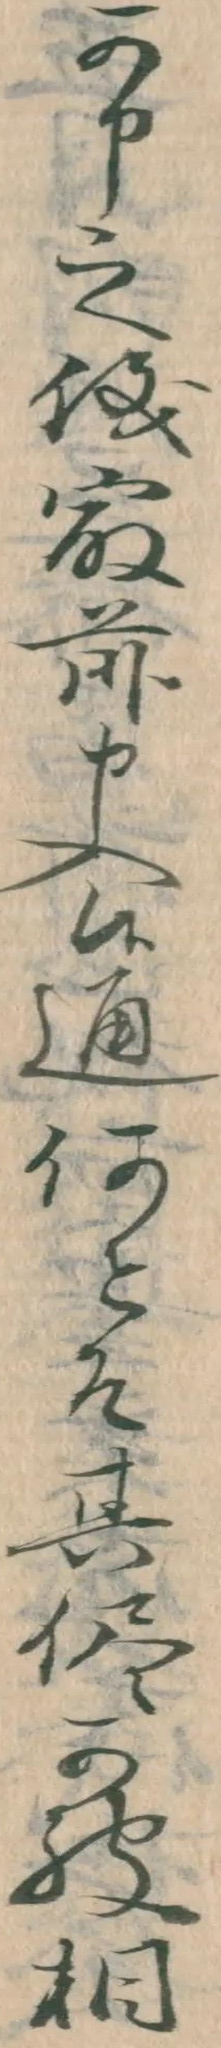可申之儀最前申入候通何とそ其侭可被相
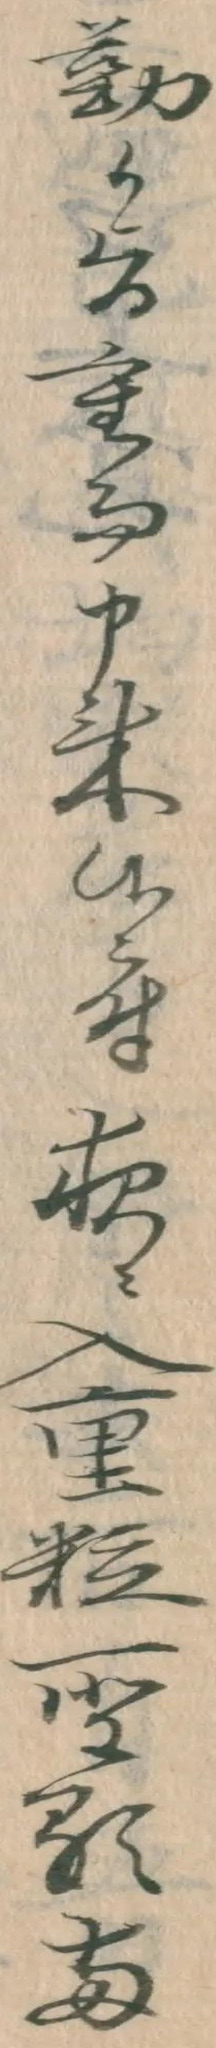勤候旨重而申来候ニ付夜ニ入重粒聖顕両
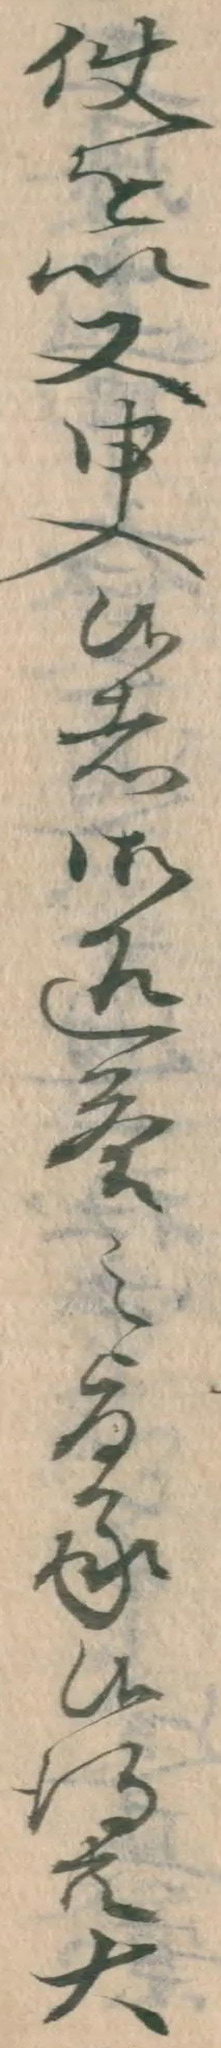使を以又申入候者御返答之旨承候得共大
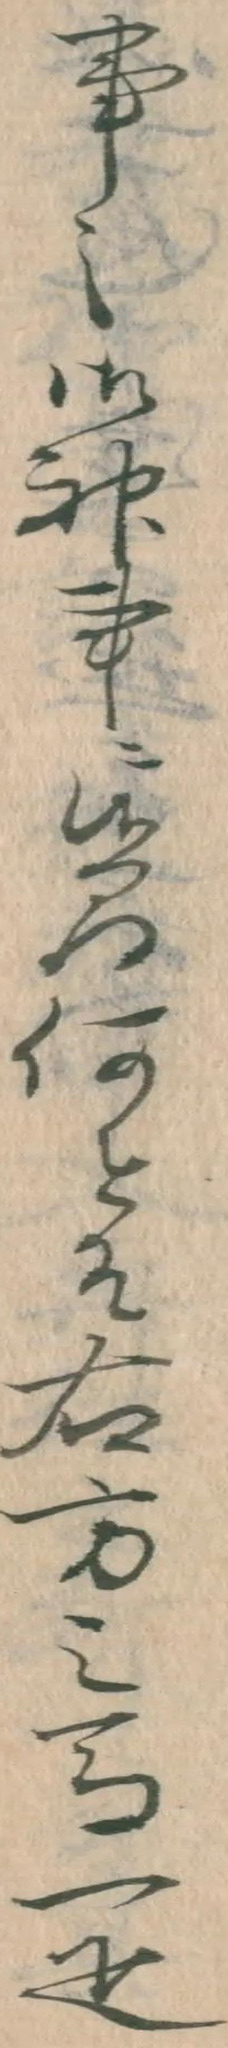事之御神事ニ候間何とそ右方之馬一疋
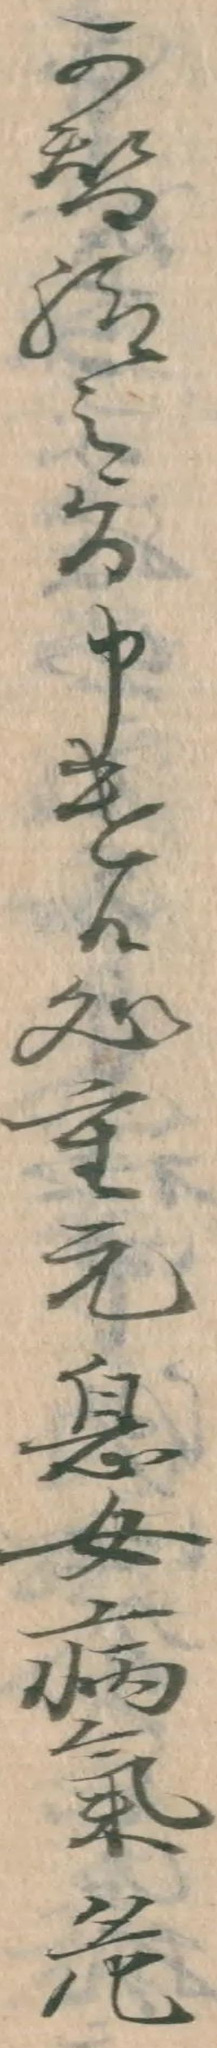可替給之旨申遣候処重元息女病気危
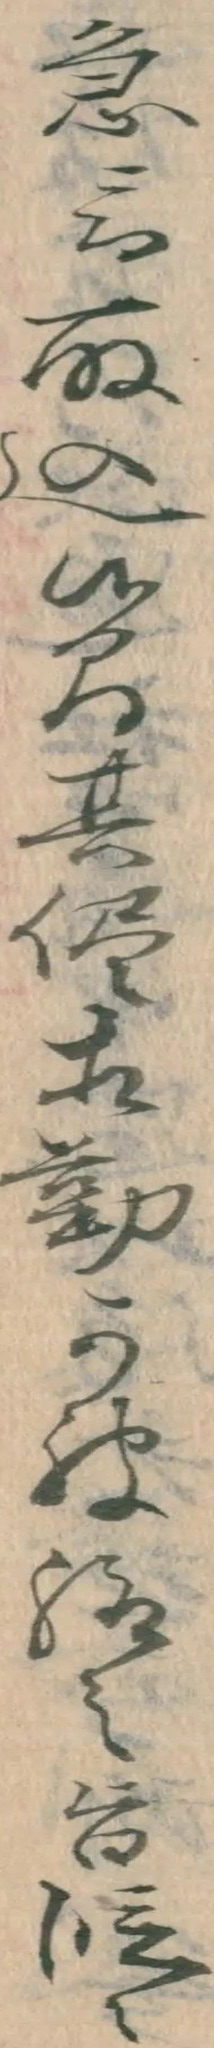急ニ而取込候間其侭相勤可被給之旨段々
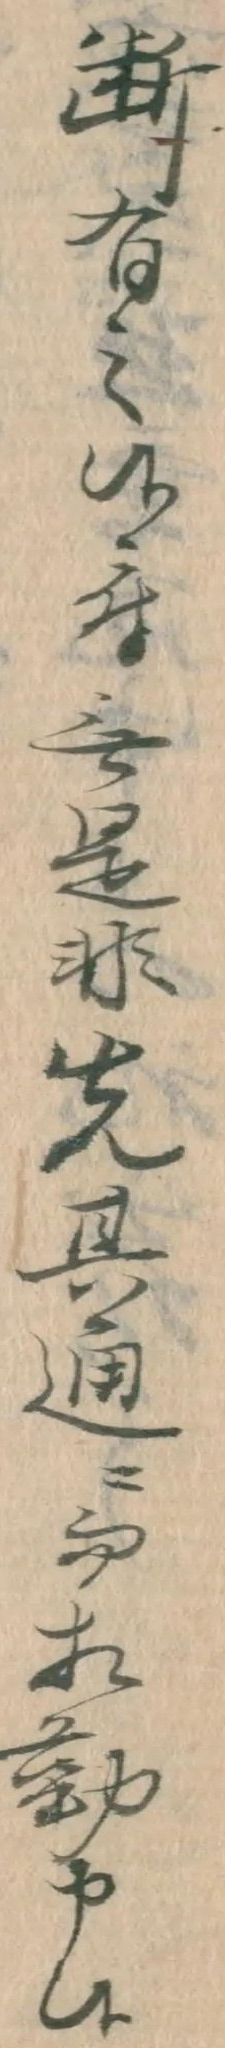断有之候ニ付無是非先其通ニ而相勤申候
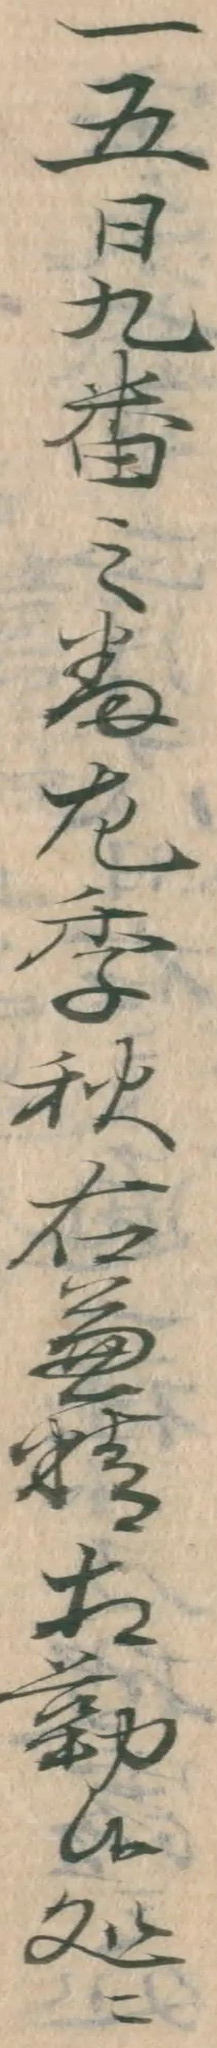一五日九番之番左季秋右兼精相勤候処ニ
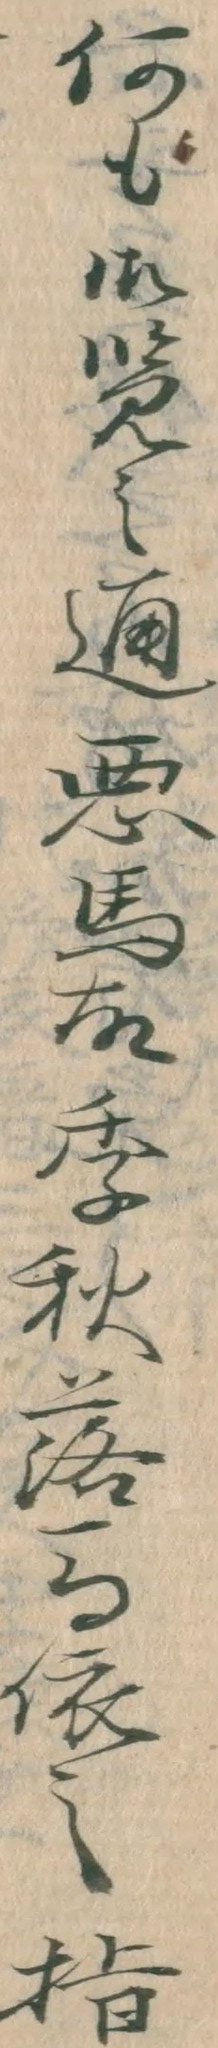何も御覧之通悪馬故季秋落馬依之指
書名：賀茂社記録. 第10冊
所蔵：国立国会図書館 National Diet Library, JAPAN
